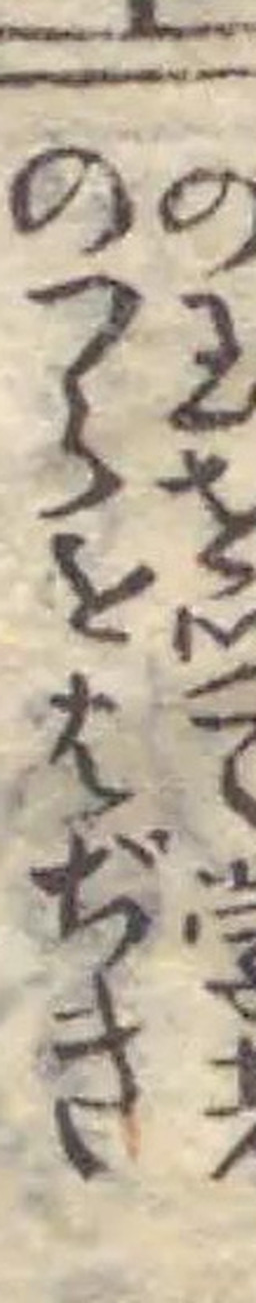のつらをはじき
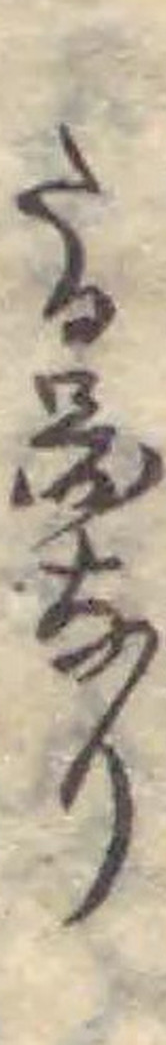たる図なり
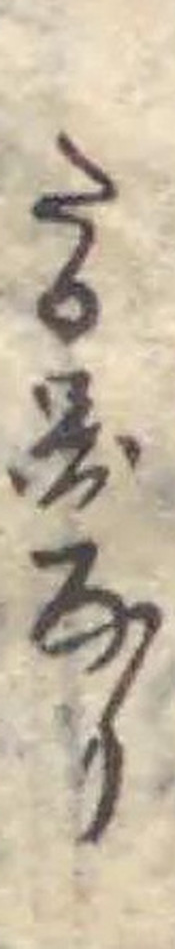たる図なり
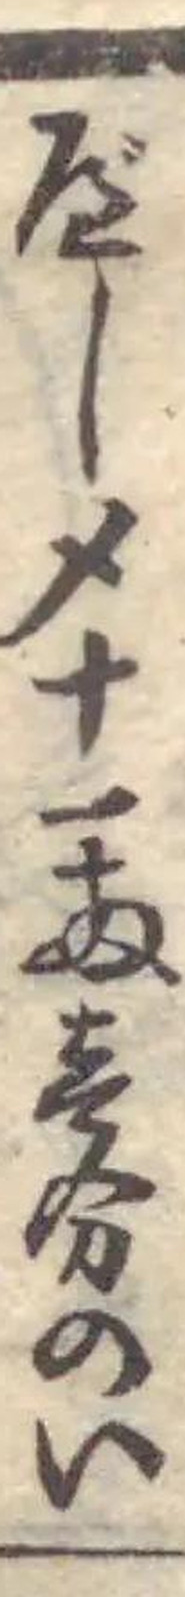べし〆十一両壱分のい
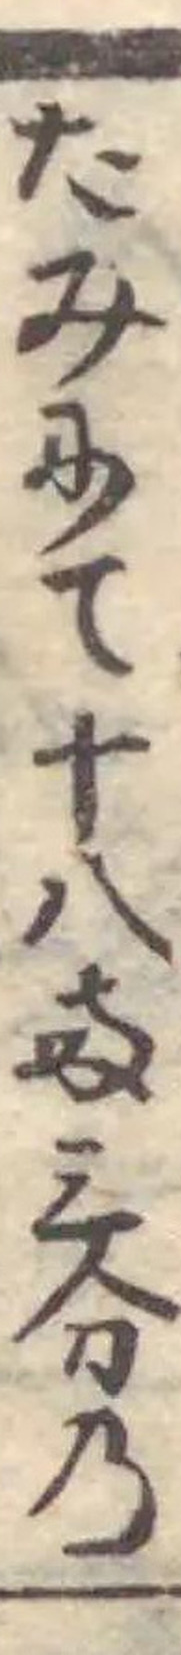たみにて十八両三分の
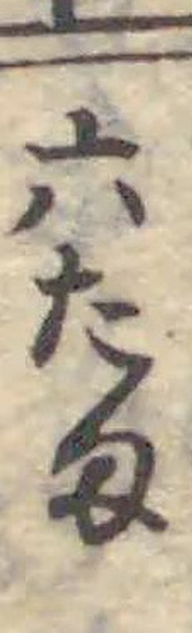六たま
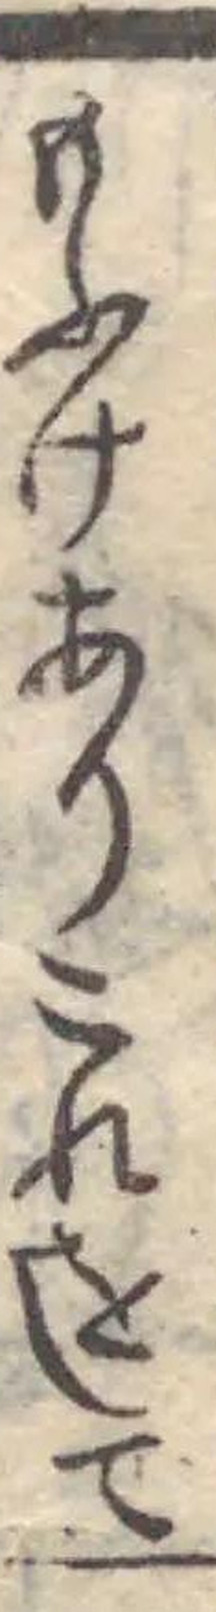もふけありこれをして
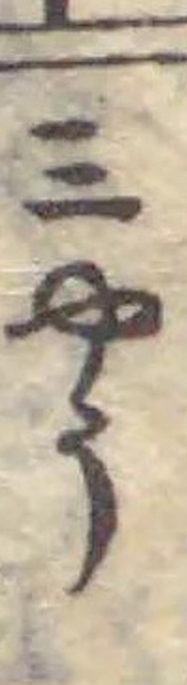三やう
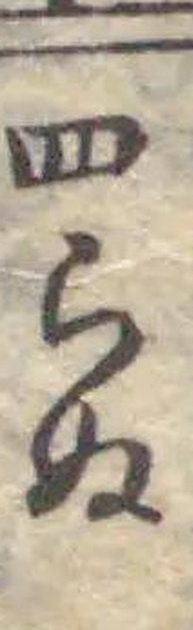四らぬ
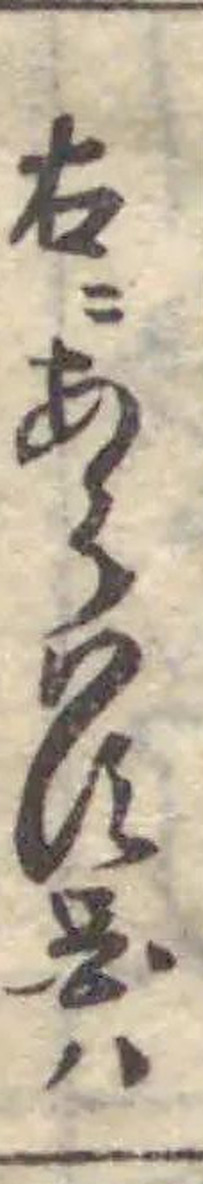右にあらはす図は
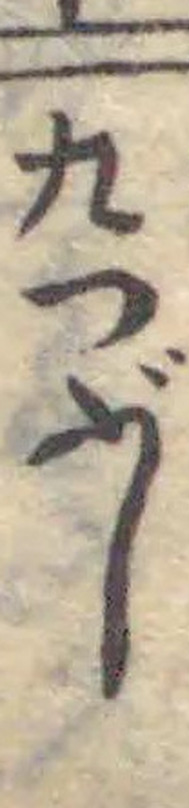九つぶし
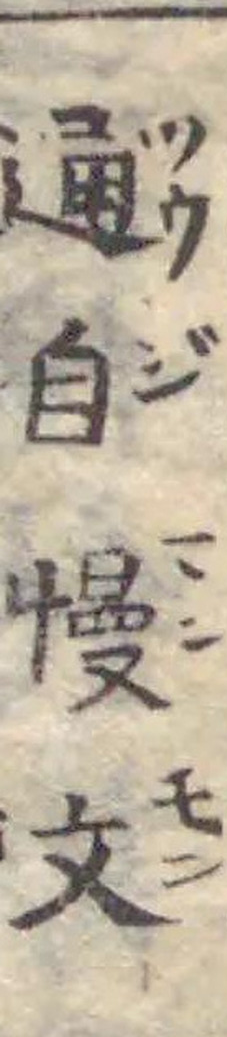通自慢文
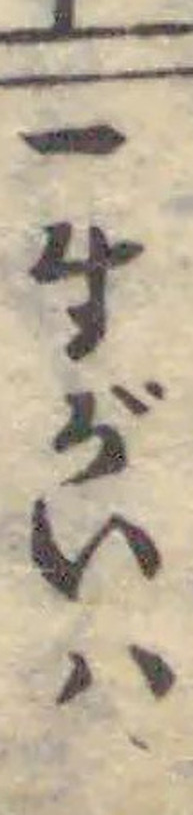一生がいは
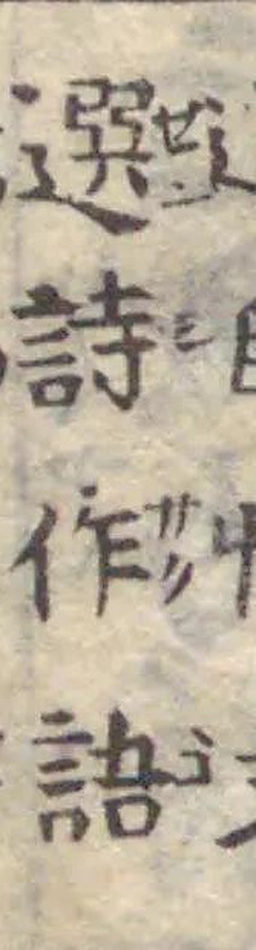選詩作語
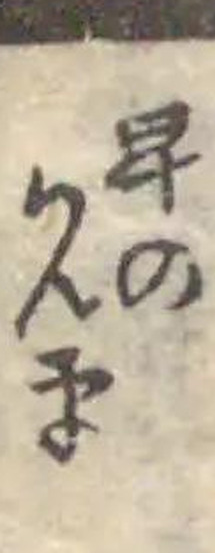かん平
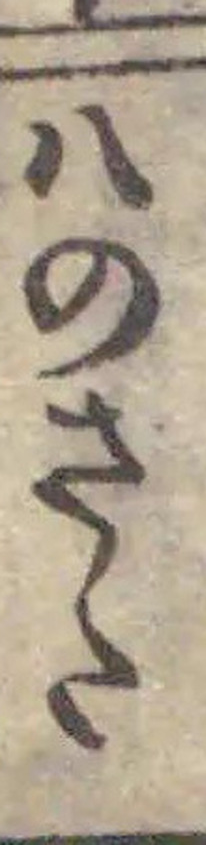八のさた
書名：大通人好記
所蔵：国立国会図書館 National Diet Library, JAPAN
